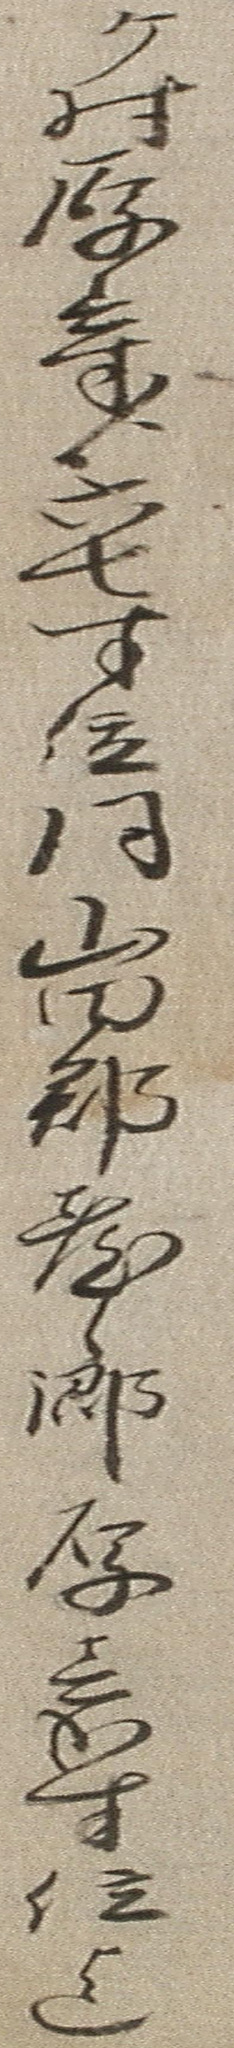ヶ村厚壱寸ゟ六七寸位同山田郡老之郷厚壱弐寸位迄
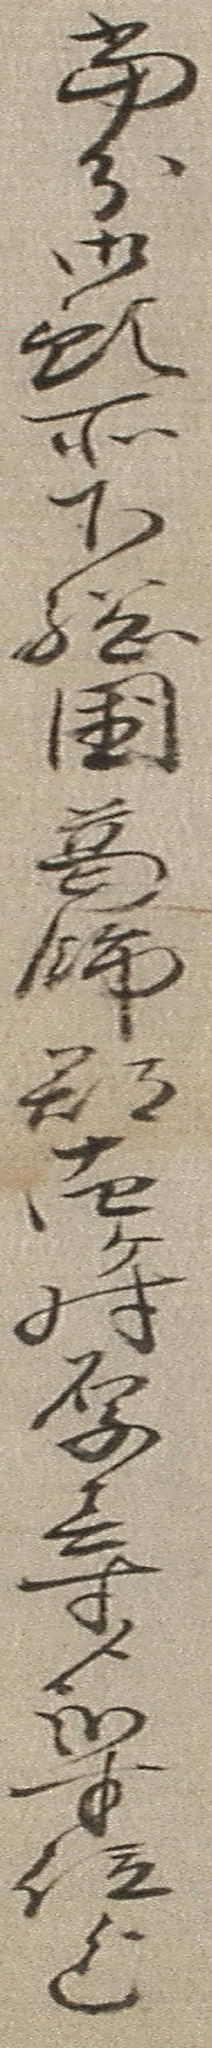当分御預所下総国葛飾郡十四ヶ村厚壱寸ゟ弐寸位迄
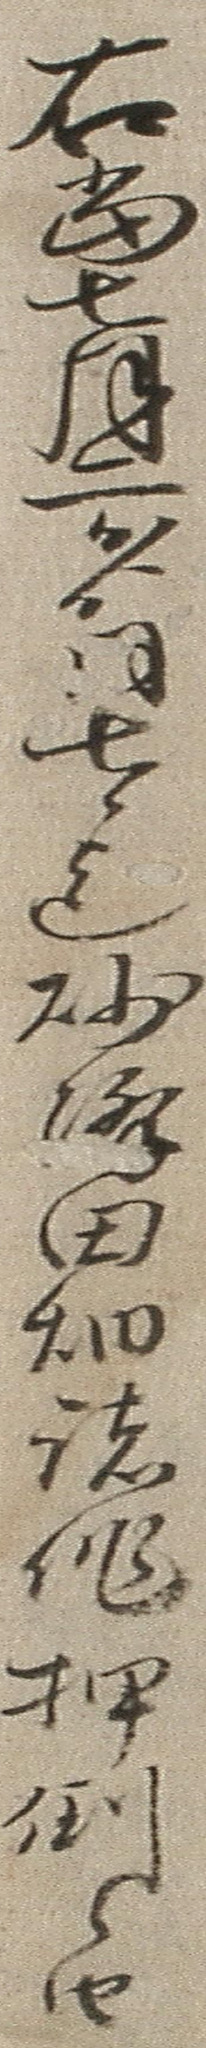右当七月二日ゟ七日迄砂降田畑諸作押倒候由
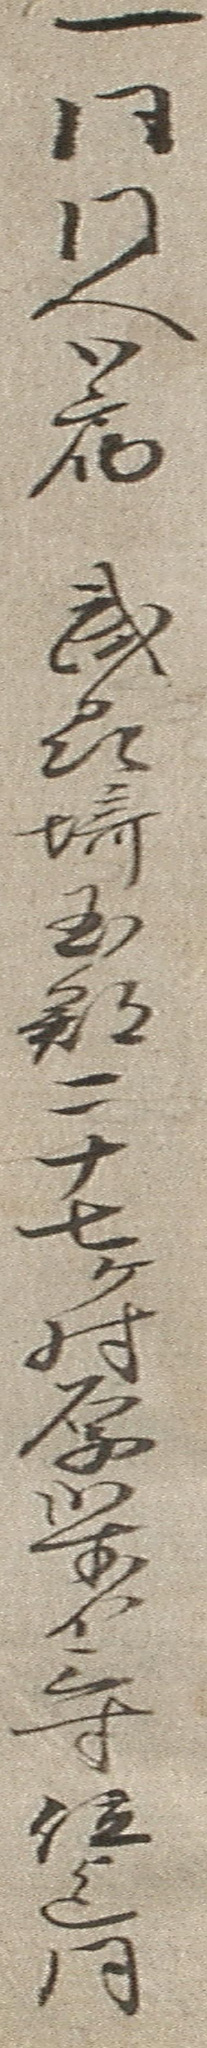一同同人御宿武州埼玉郡二十七ヶ村厚弐寸ゟ三寸位迄同
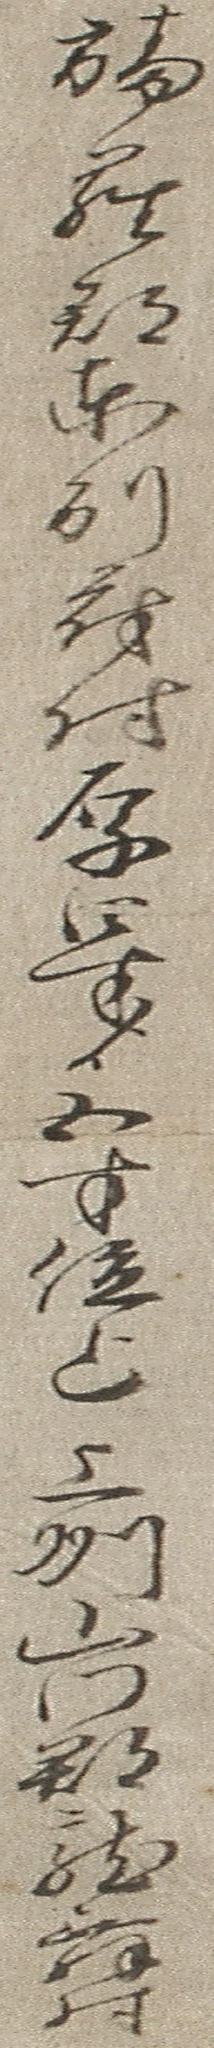旛羅郡東別府村厚四寸ゟ五寸位迄上州山田郡龍舞村
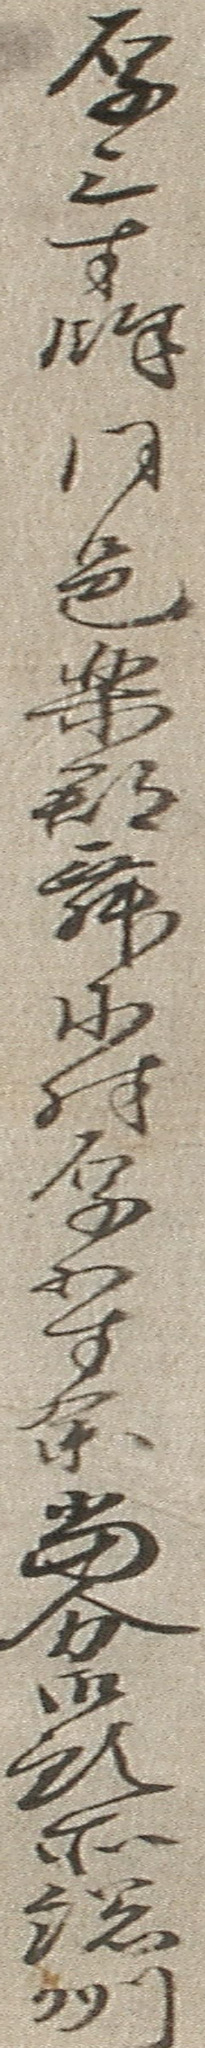厚三寸餘同邑楽郡舞木村厚五寸余当分御預所総州
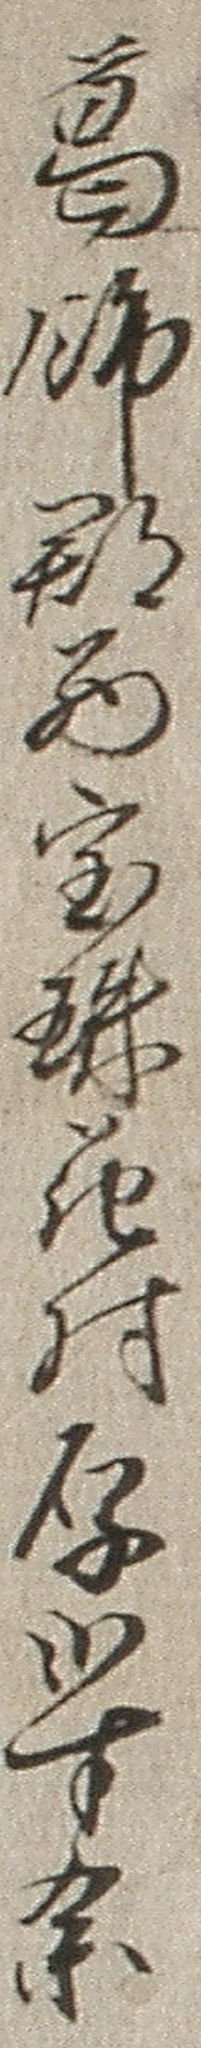葛飾郡西宝珠花村厚弐寸余
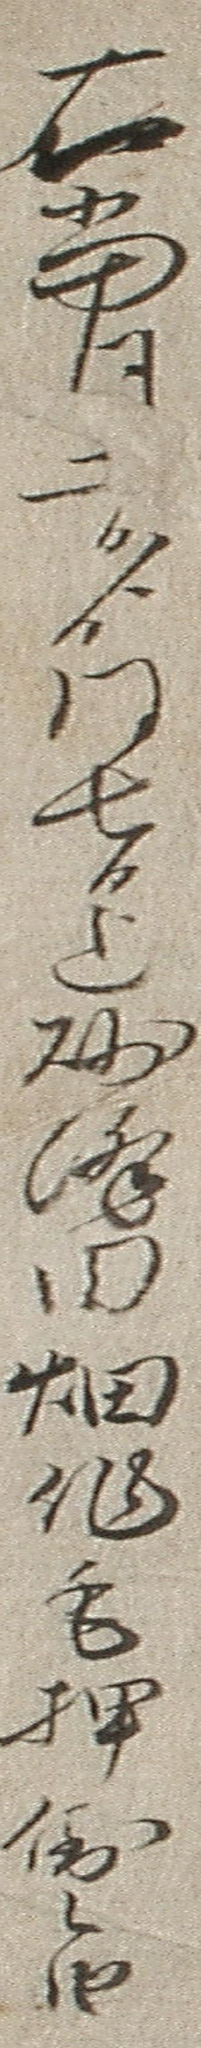右当月二日ゟ同七日迄砂降田畑作毛押倒候由
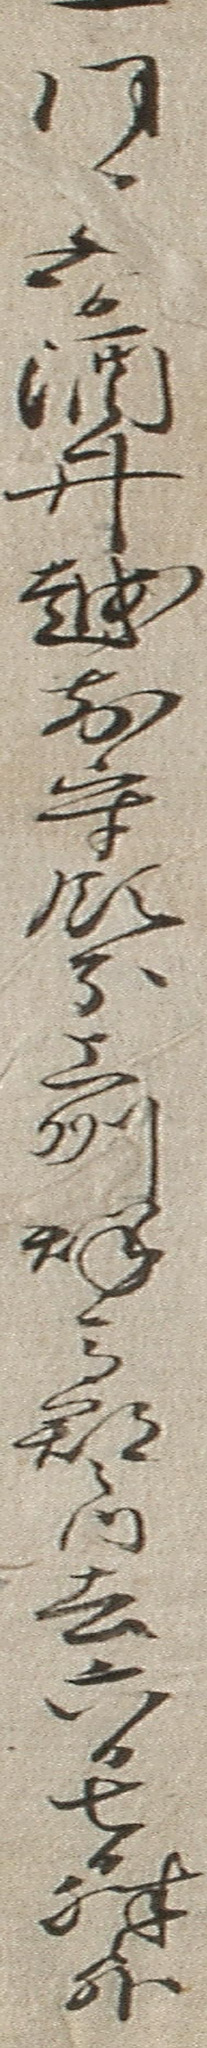一同五日酒井越前守領分上州群馬郡之内去六日七日殊之外
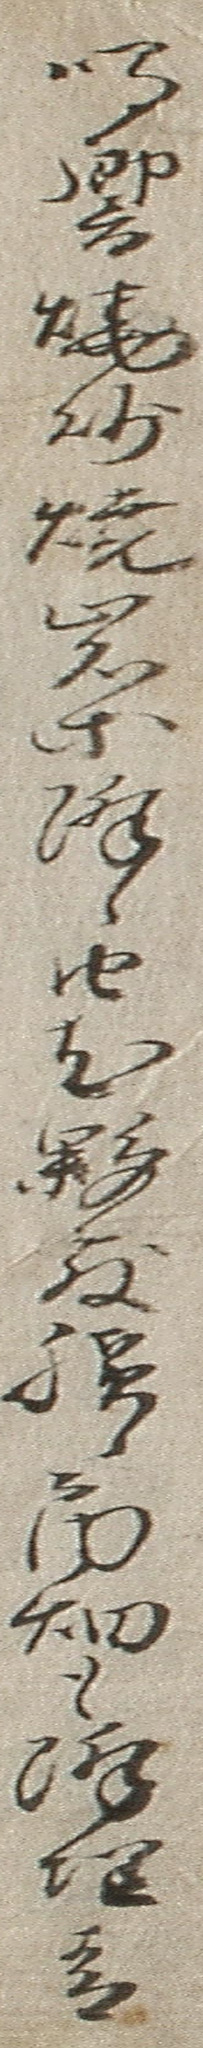鳴響焼砂焼岩等降候由尤夥敷積候而田畑も降埋青
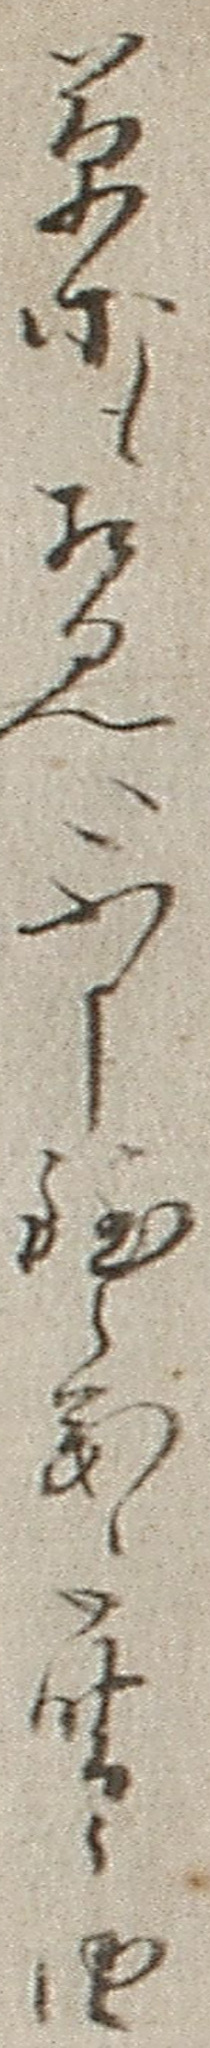草等も相見へ不申候程之義に御座候由
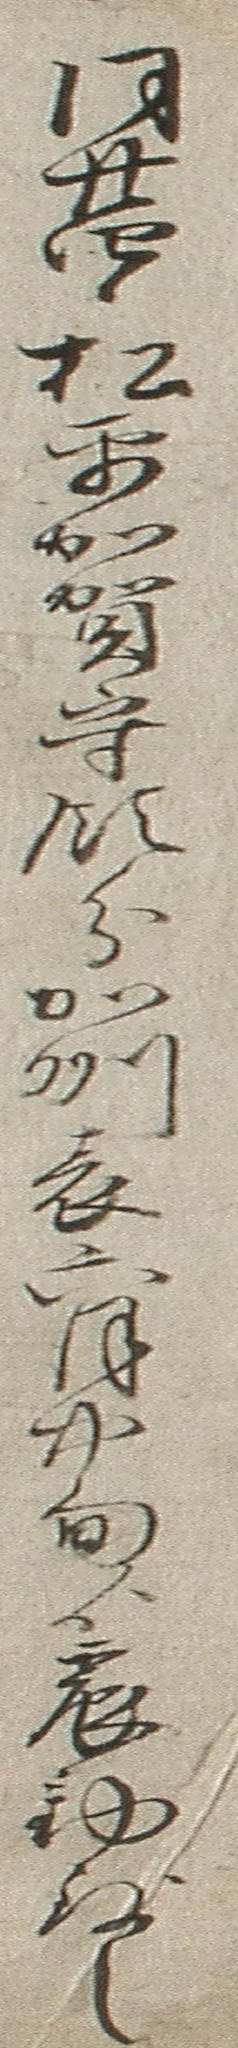一同廿四日松平加賀守領分加州表六月中旬ゟ震動致し

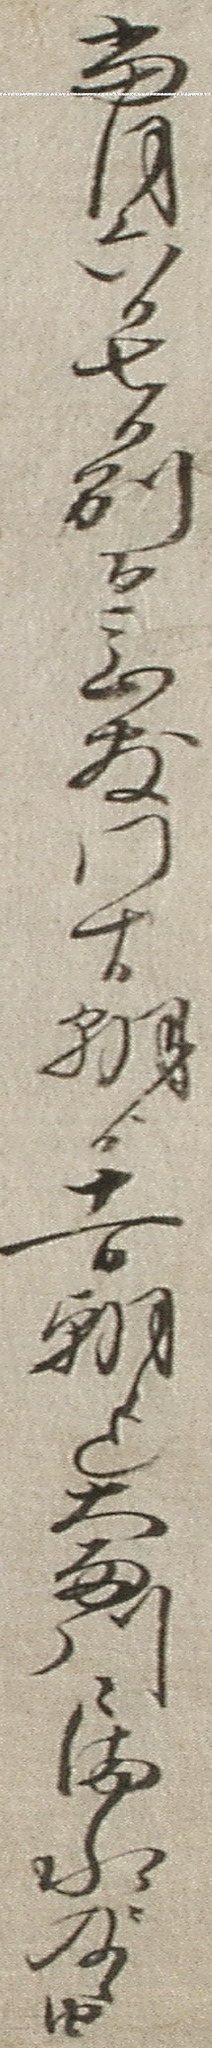当月六日七日別而甚敷同十日朝ゟ十一日朝迄大雨川々満水ニ及候由
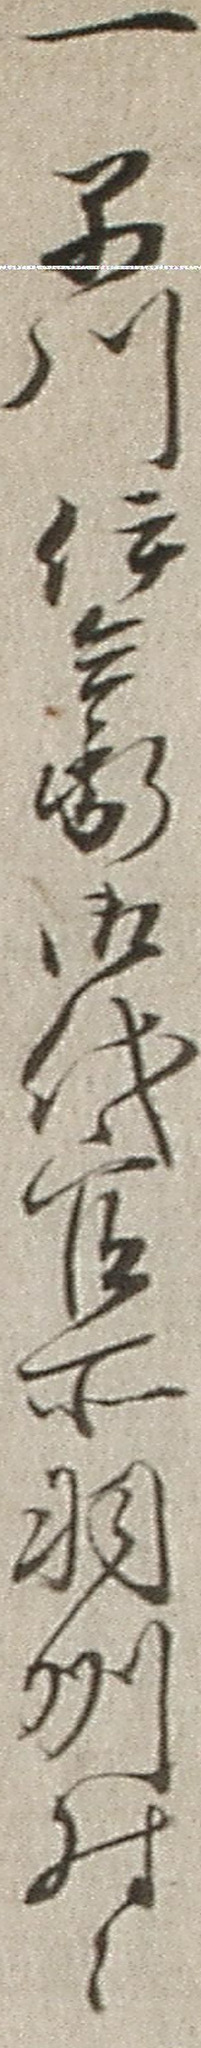一早川伊兵衛御代官所羽州村々
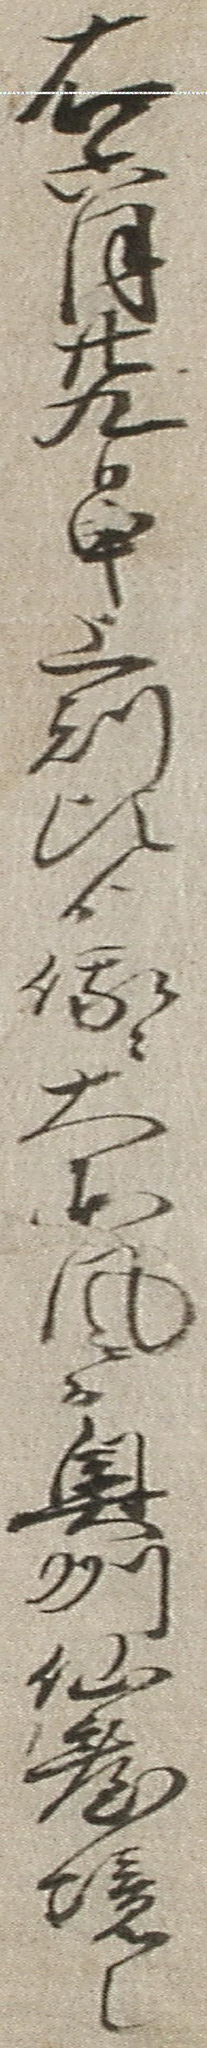右六月廿九日申上刻頃ゟ俄ニ大東風ニ而奥州仙台境之
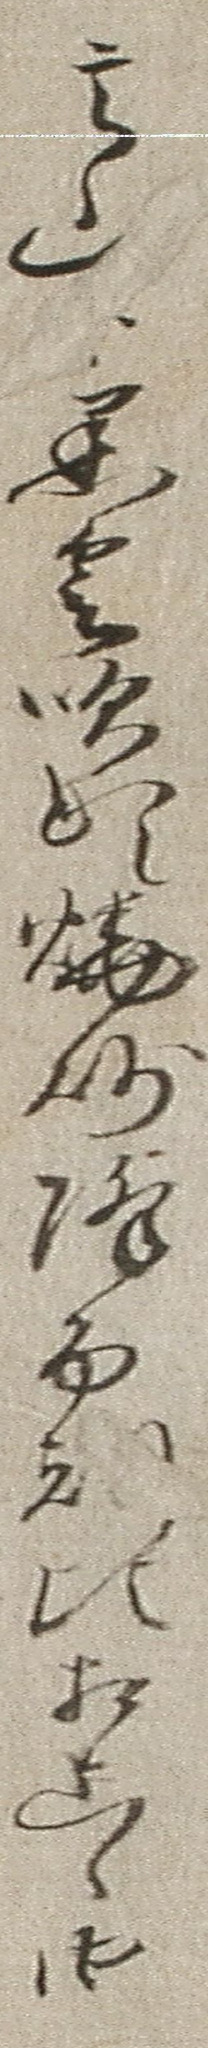高山黒雲吹出し焼砂降酉刻比相止候由
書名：太平秘録抜書　浅間山燒及普賢山崩
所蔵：東京大学地震研究所図書室 Earthquake Research Institute Library, The University of Tokyo, JAPAN
